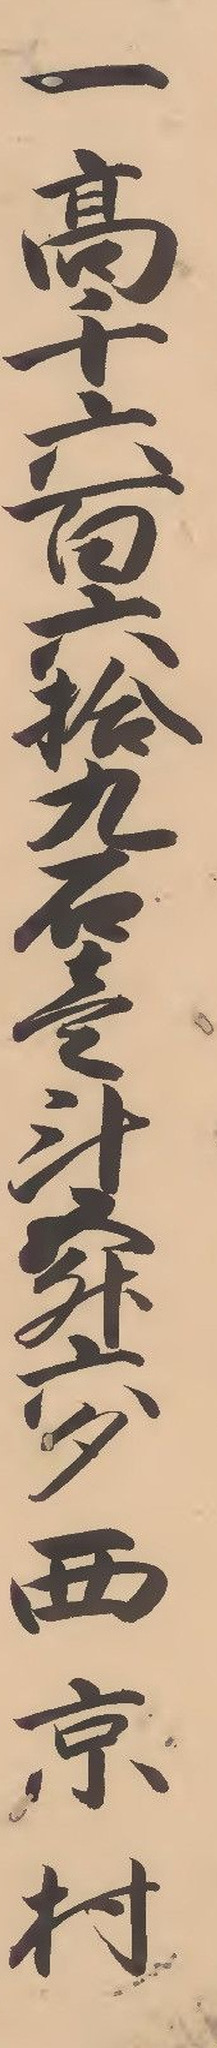一高千六百六拾九石壱斗五升六勺西京村
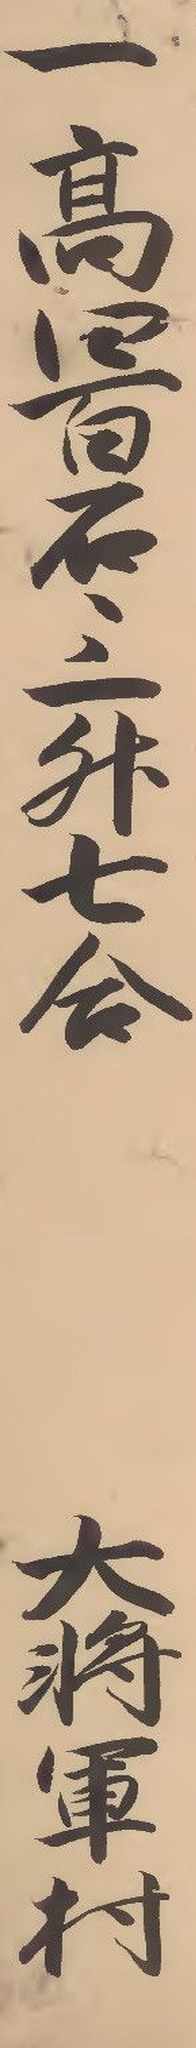一高四百石三升七合大将軍村

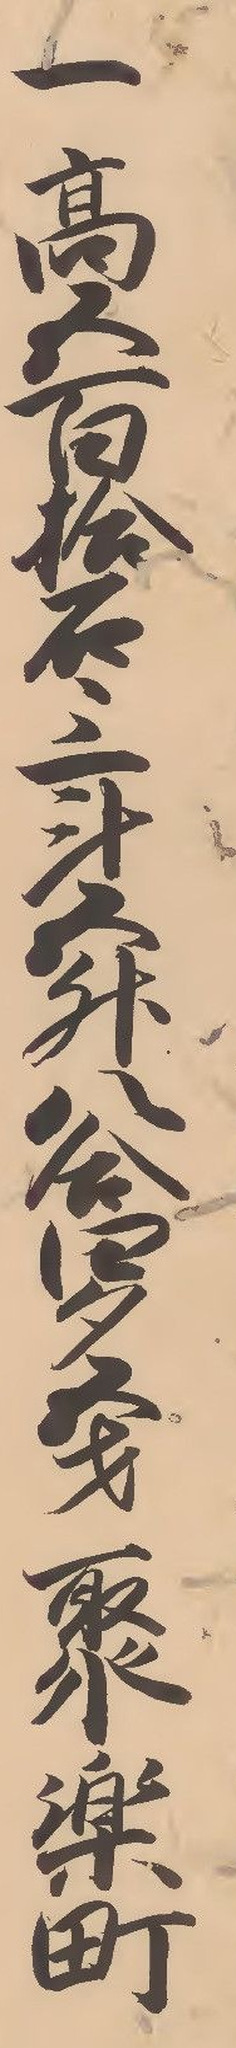一高五百拾石三斗五升八合四勺五才聚楽町
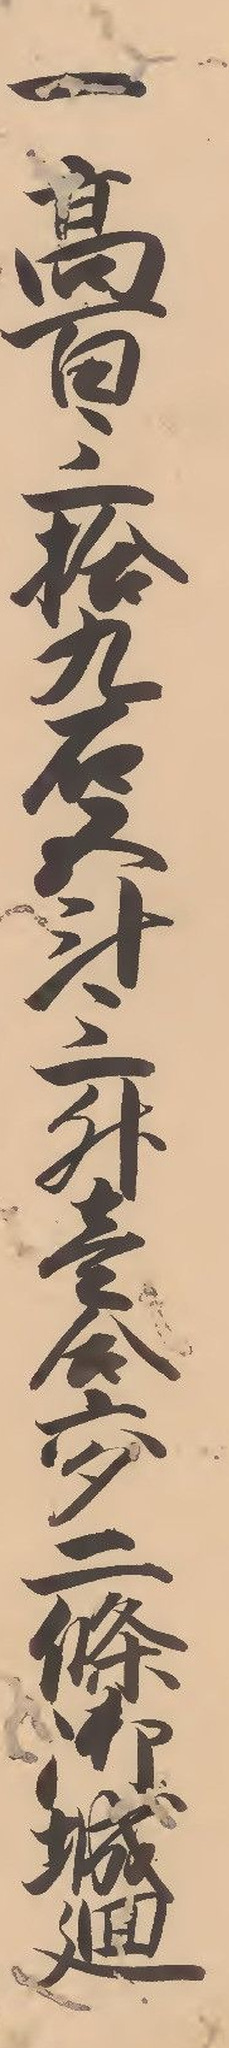一高百三拾九石五斗三升壱合六勺二条御城廻
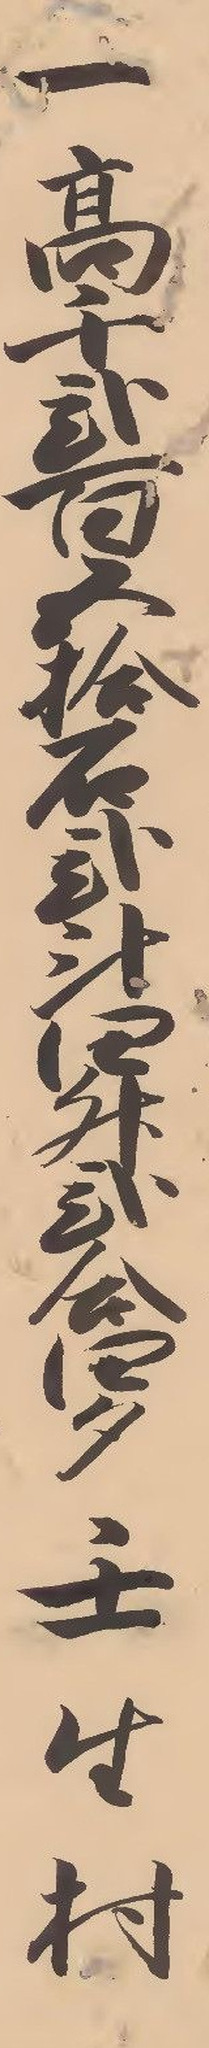一高千弐百五拾石弐斗四升弐合四勺壬生村
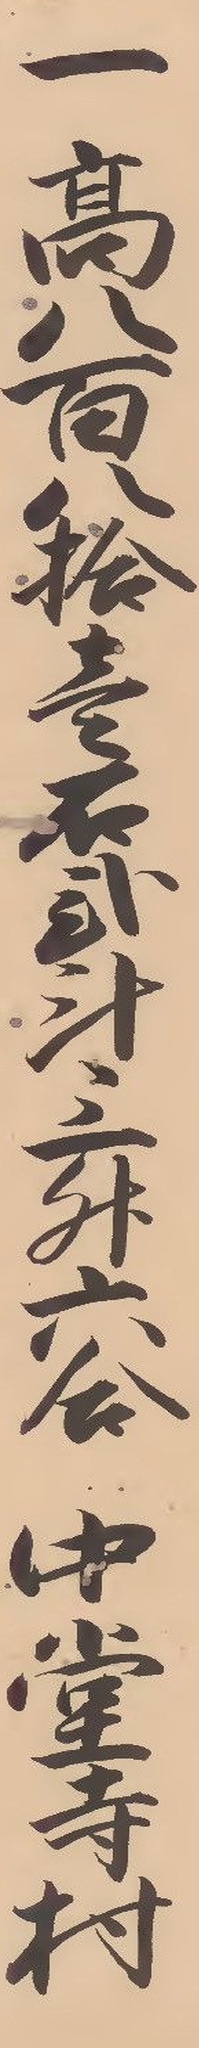一高八百八拾壱石弐斗三升六合中堂寺村
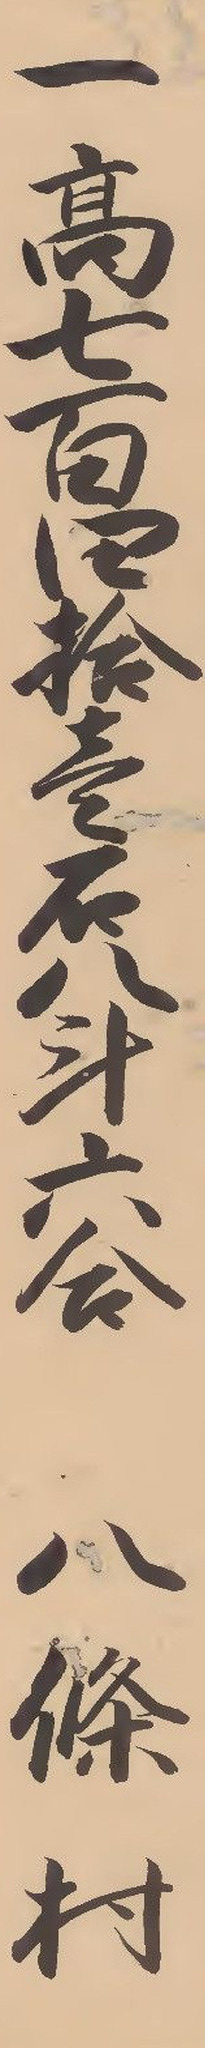一高七百四拾壱石八斗六合八条村
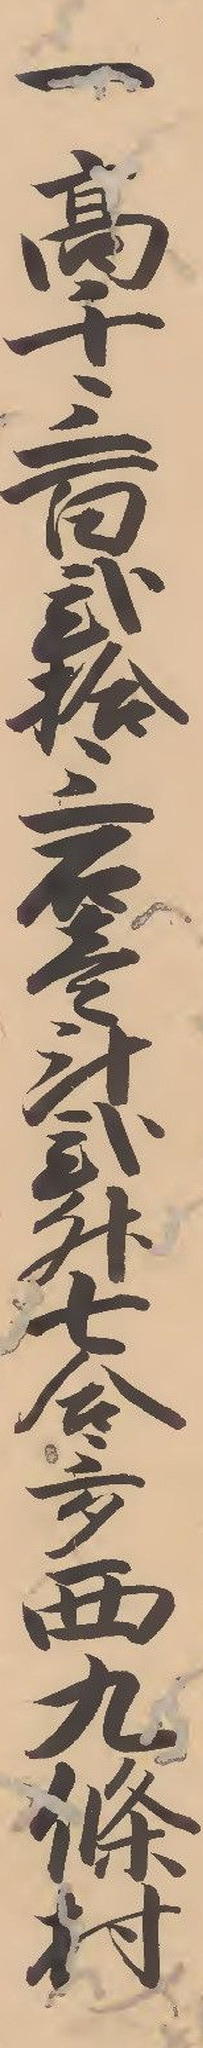一高千三百弐拾三石壱斗弐升七合三勺西九条村
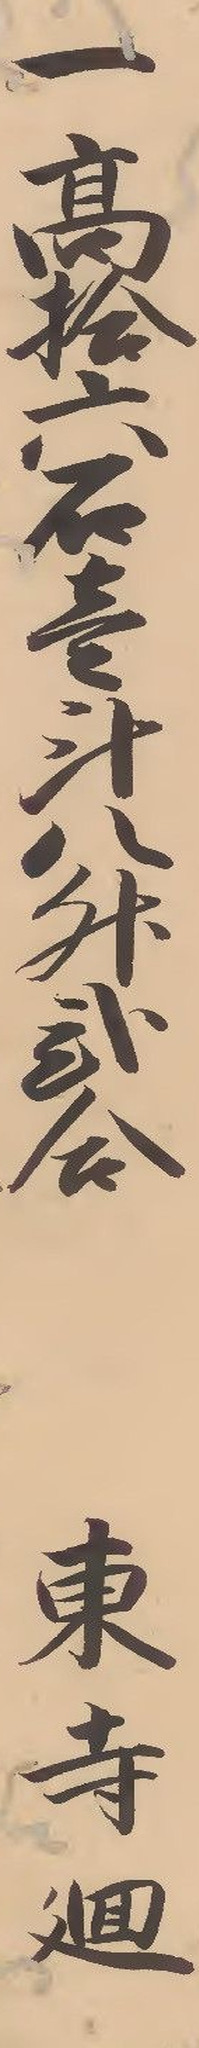一高拾六石壱斗八升弐合東寺廻

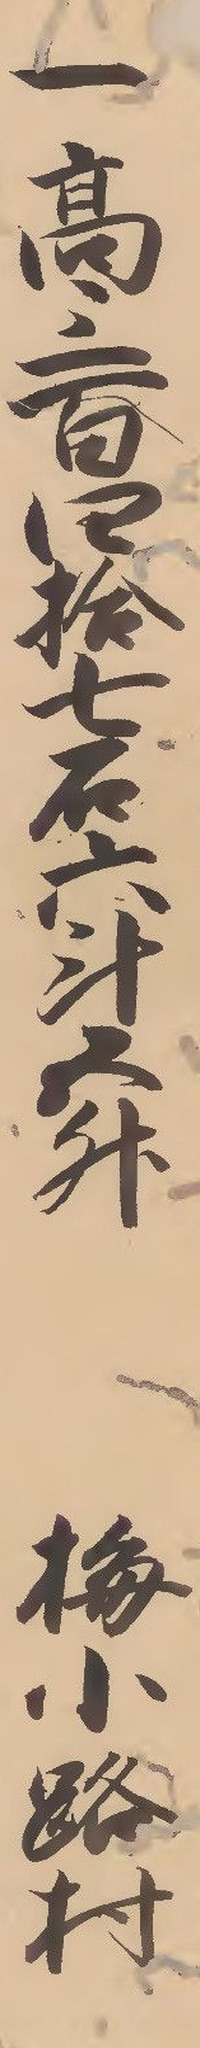一高三百四拾七石六斗五升梅小路村
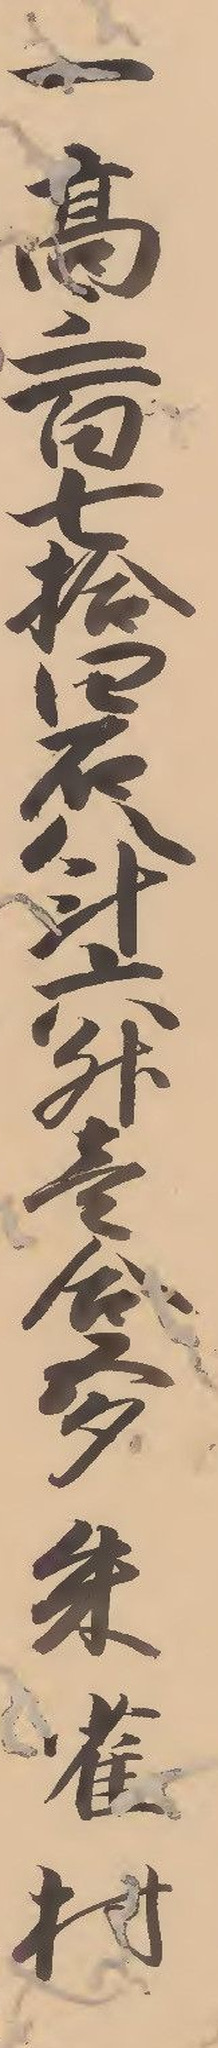一高三百七拾四石八斗六升壱合五勺朱雀村
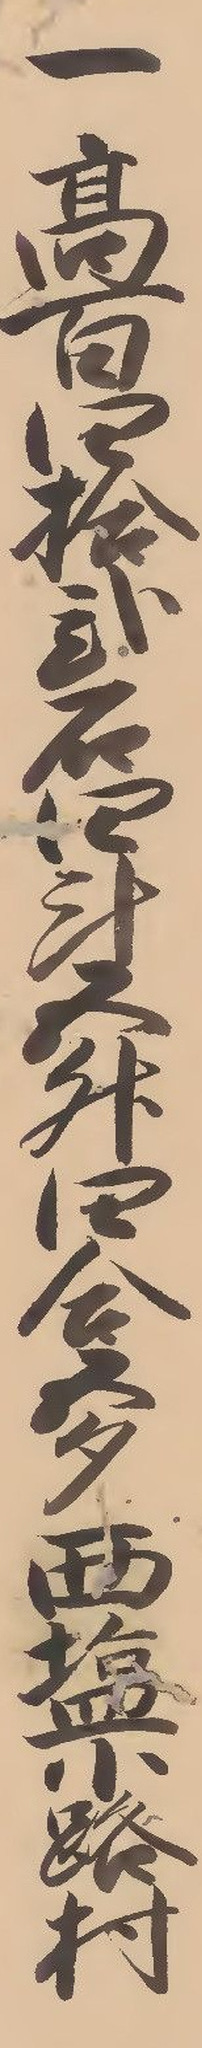一高百四拾弐石四斗五升四合五勺西塩小路村
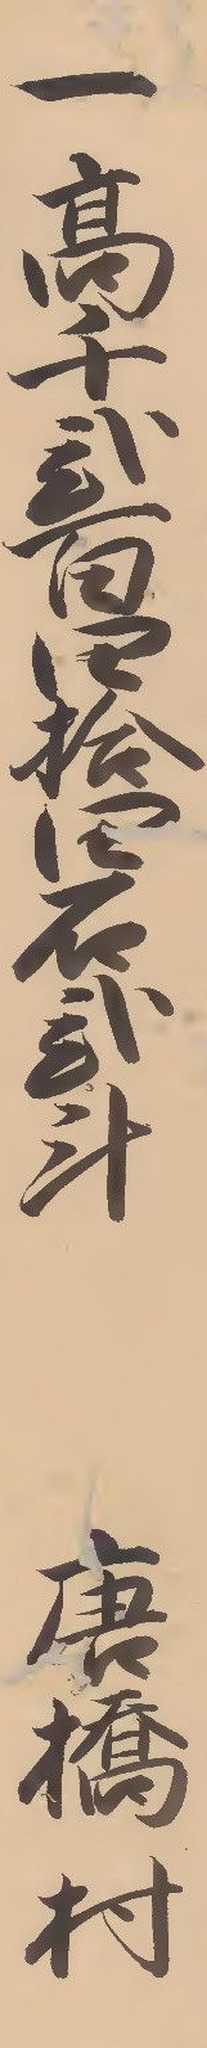一高千弐百四拾四石弐斗唐橋村
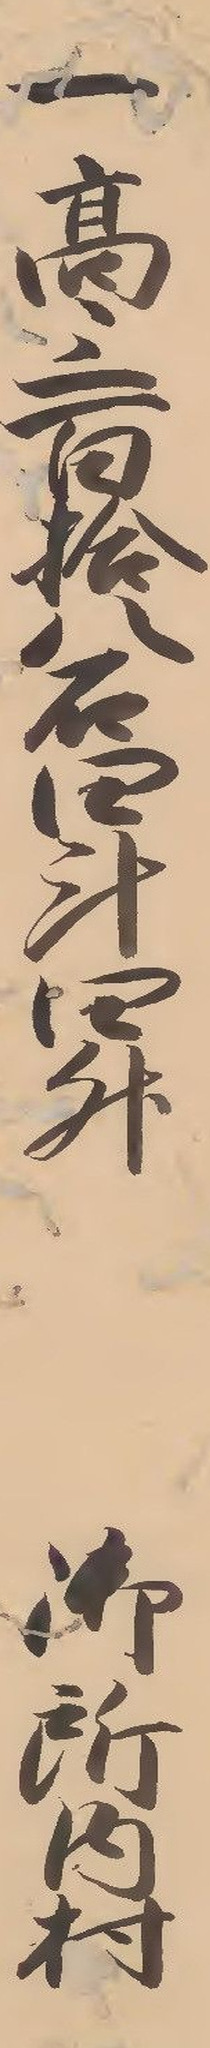一高三百拾八石四斗四升御所内村
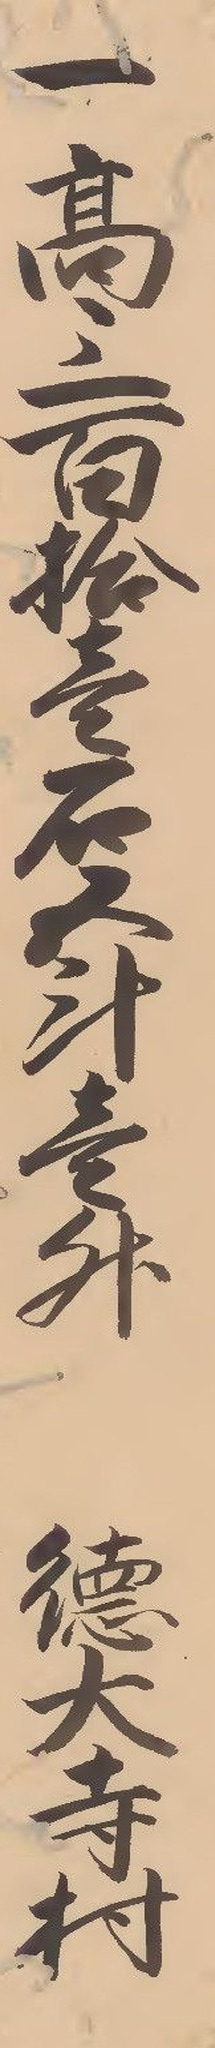一高三百拾壱石五斗壱升徳大寺村

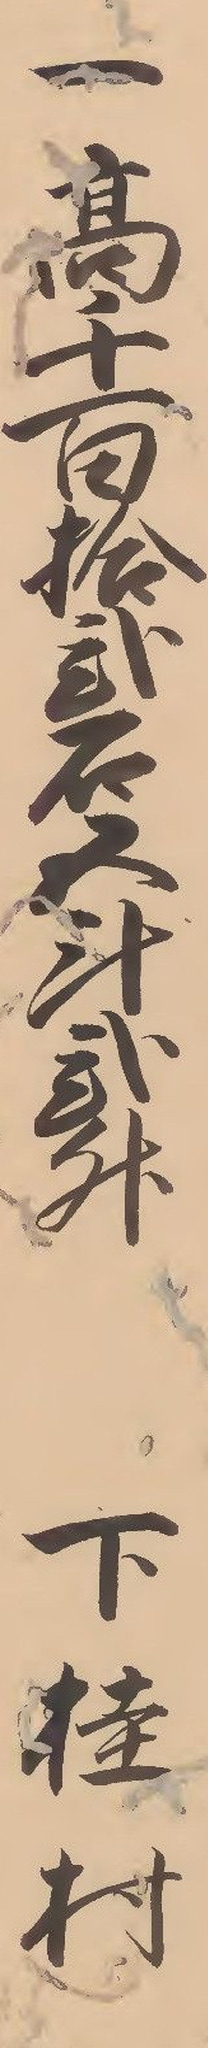一高千百拾弐石五斗弐升下桂村
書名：山城国郷帳
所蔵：国立公文書館 National Archives of Japan
